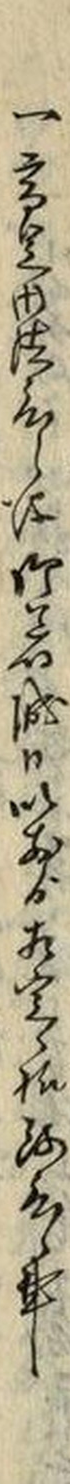一高足御法度之儀御着城候以前ゟ相定候様致度候事
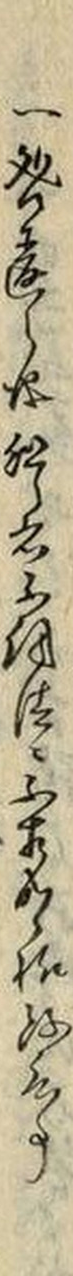一咎違之儀組之者不調法ニ不相成候様致度事
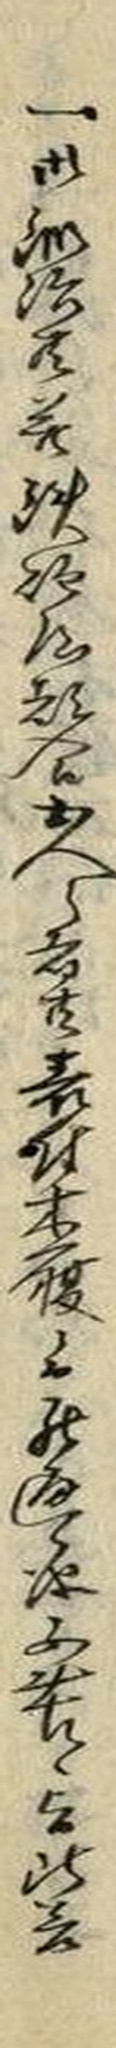一御鍛冶共并鉄砲屋都合五人之者共表付木履ニ而罷通候儀不苦候旨断差
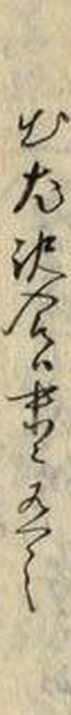出尤訳合ハ未ニ有之
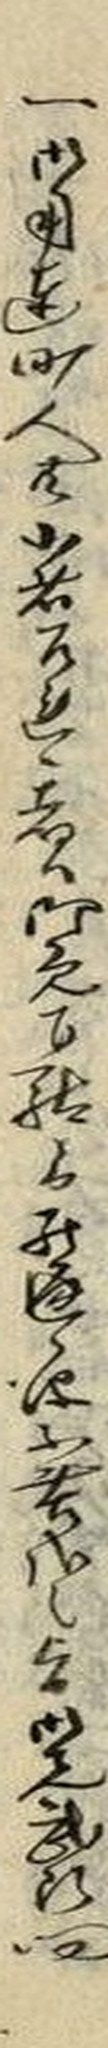一御用達町人共小者召連候者ハ御免下駄ニ而罷通候儀不苦哉之旨御先武頭問
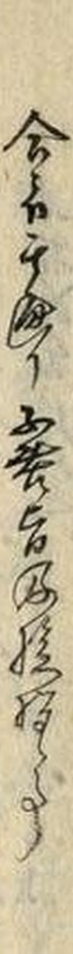合ニ付其通り不苦旨及挨拶候事
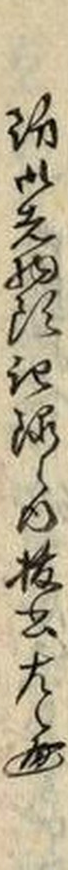附御先物頭記録之内抜書左之通
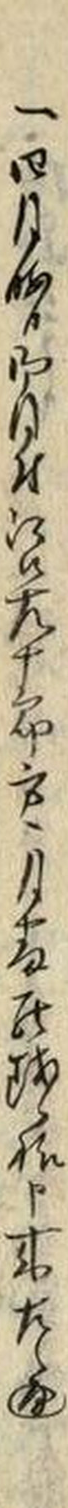一四月晦日御目付江口左十郎方へ月番罷越候様申来左之通
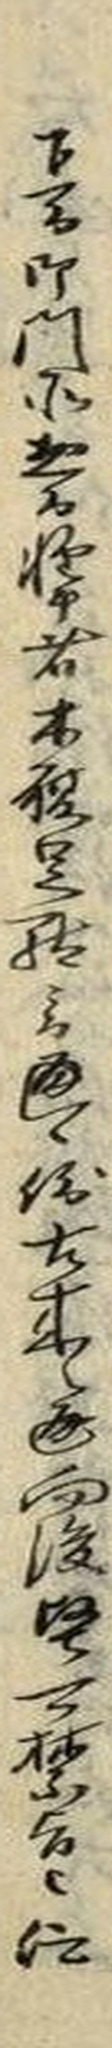下馬御門所惣而軽キ者木履足駄ニ而通候例古来之通向後堅可禁旨被仰
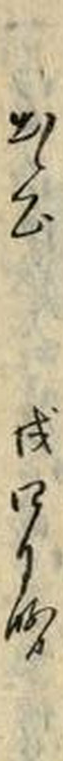出候以上戌四月晦日

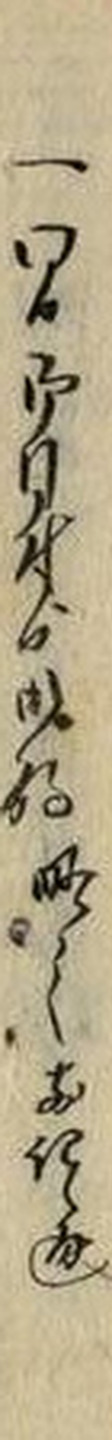一同日御目付ゟ御触略之前記之通
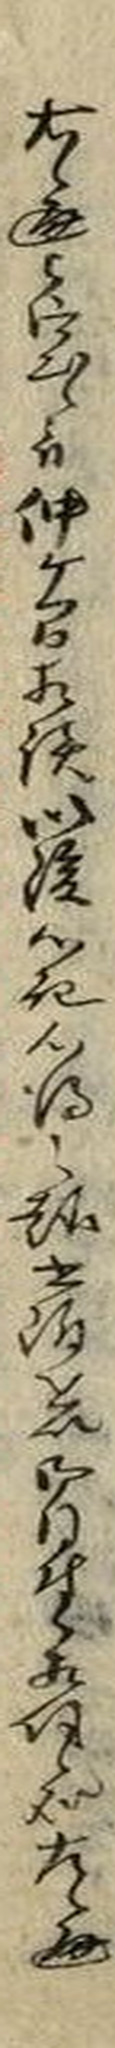右之通被仰出候ニ付仲ヶ間相談以後ハ心配心得之趣書附を以御目付へ相伺候処左之通
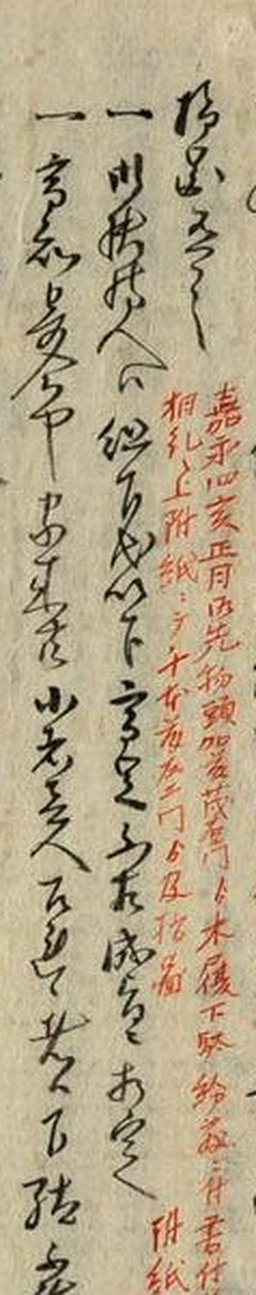一御扶持人ハ組下代以下高足不相成旨ニ相定
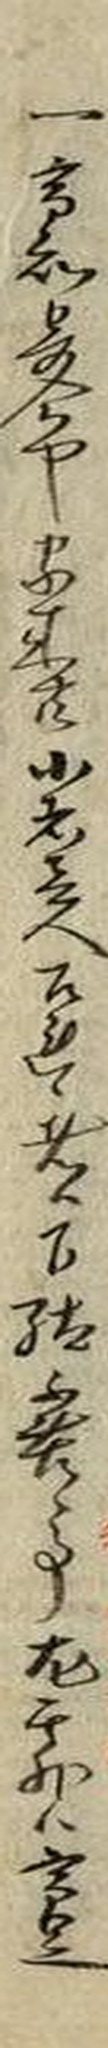一高知寄合中家来共小者壱人召連候者ハ下駄不苦候事尤其外ハ高足
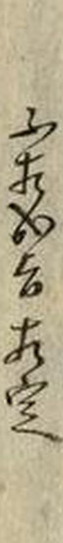不相成旨相定
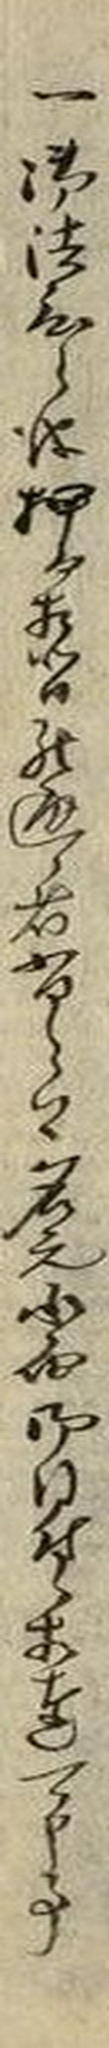一御法度之儀押而相背罷通候者有之候ハヽ名元承届御目付へ相達可申事
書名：御門御櫓之部
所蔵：福井県文書館 Fukui Prefectural Archives
